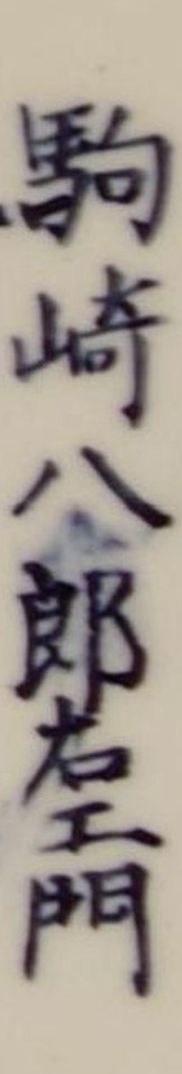駒崎八郎右エ門
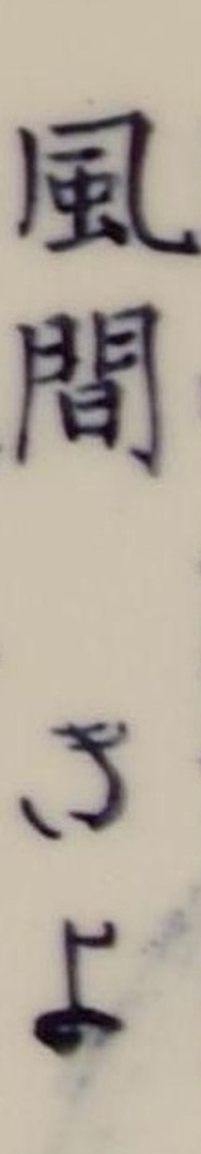風間さよ
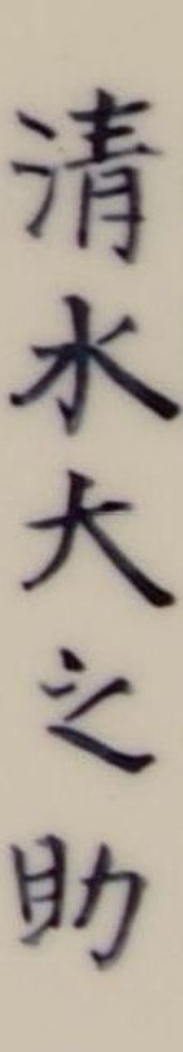清水大之助
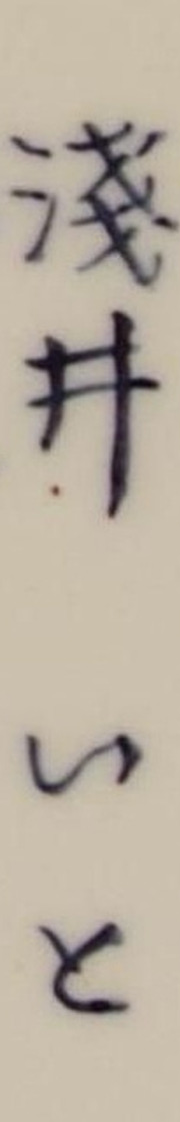浅井いと
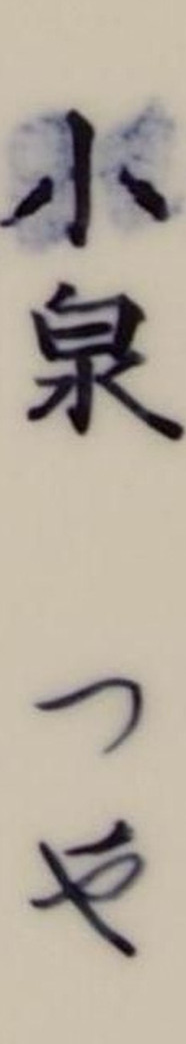小泉つや
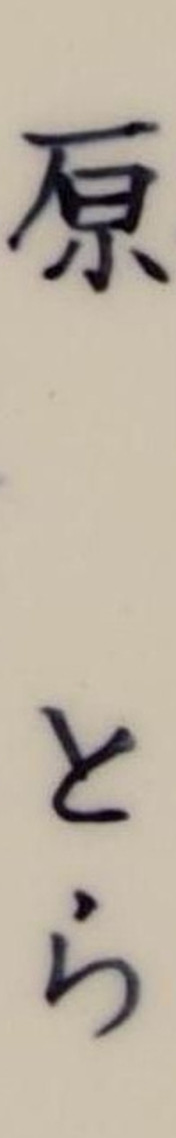原とら
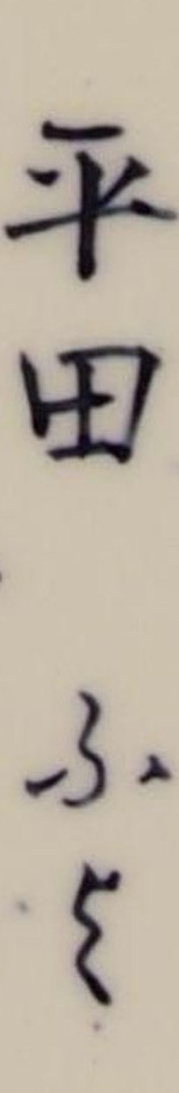平田ふく
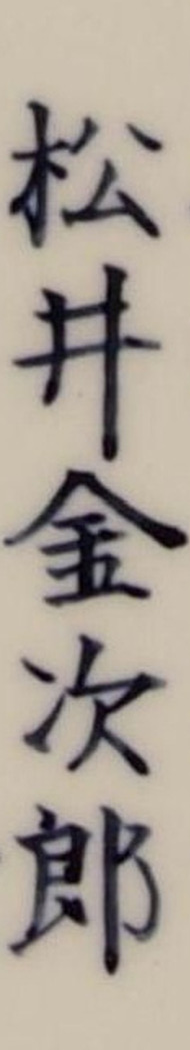松井金次郎
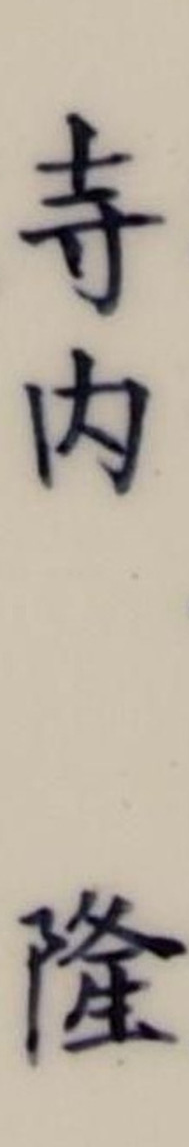寺内隆
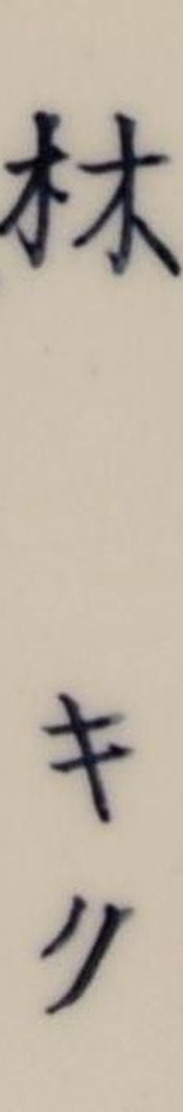林キク
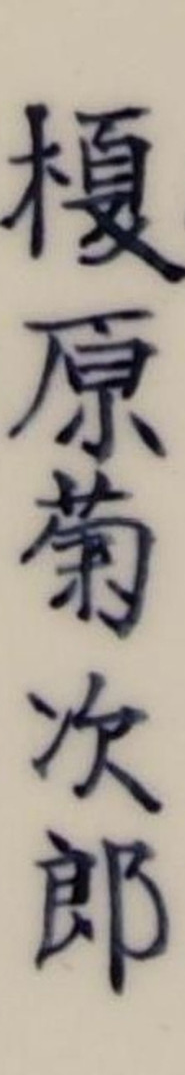榎原菊次郎
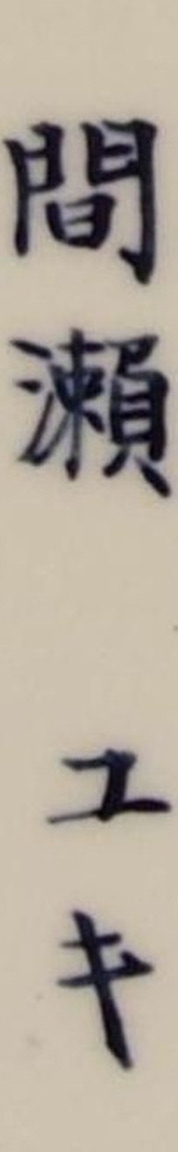間瀬ユキ
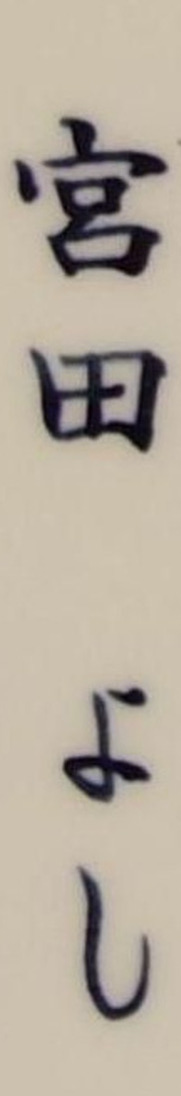宮田よし
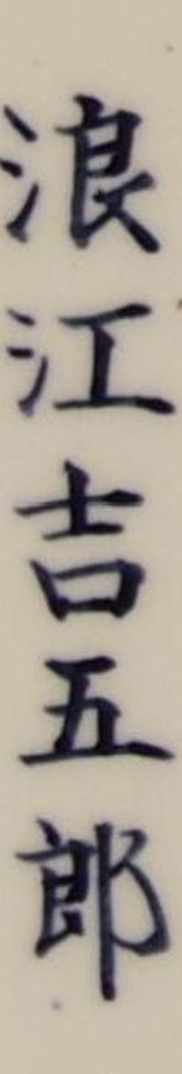浪江吉五郎
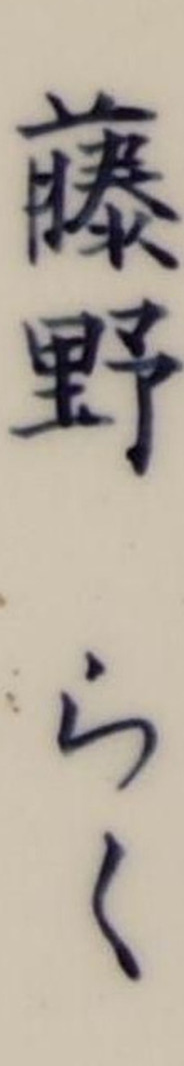藤野らく
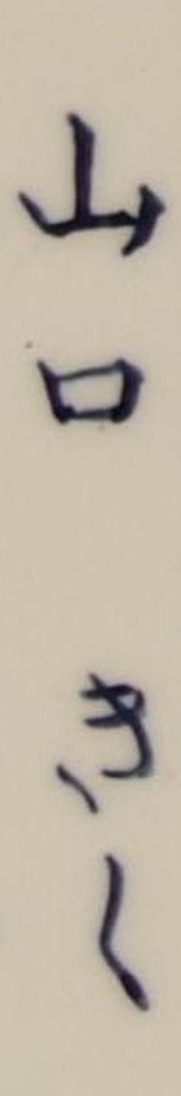山口きく
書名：E~L
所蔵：高野山金剛峯寺
